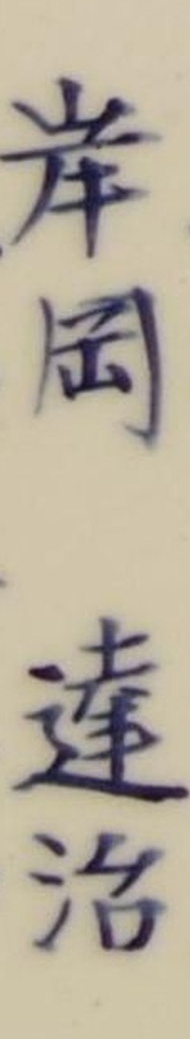岸岡達治
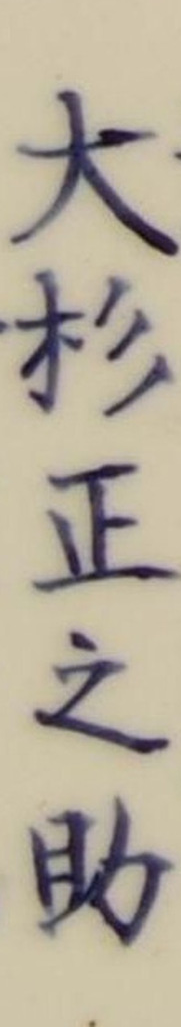大杉正之助
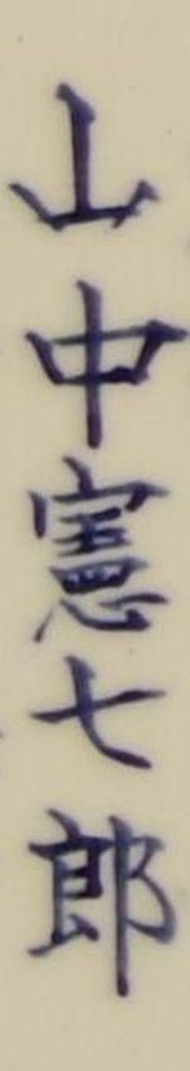山中憲七郎
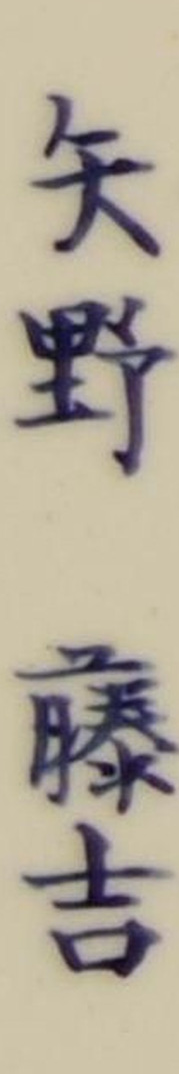矢野藤吉
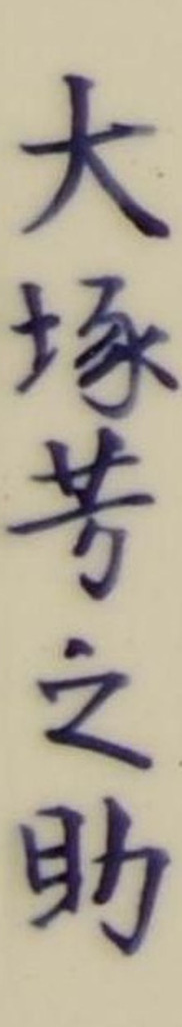大塚芳之助

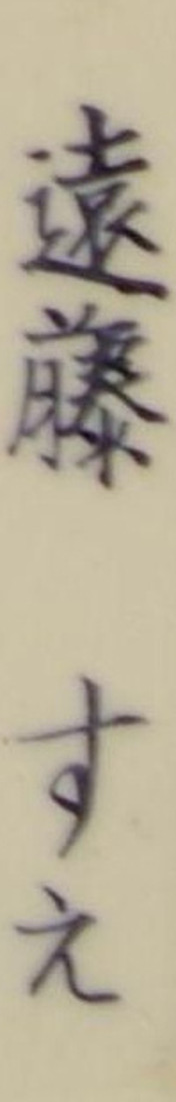遠藤すえ
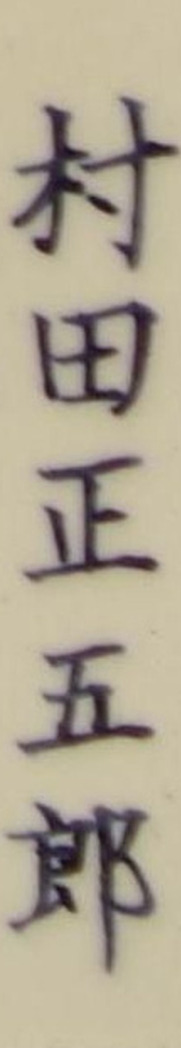村田正五郎
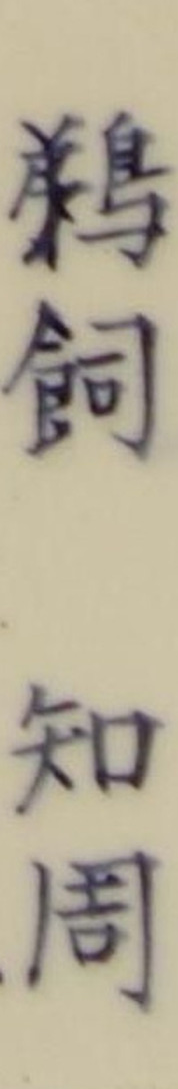鵜飼知周
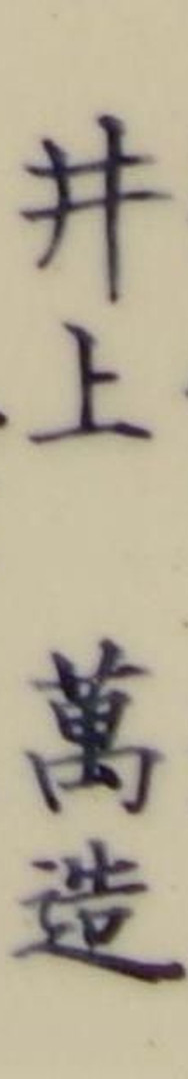井上萬造
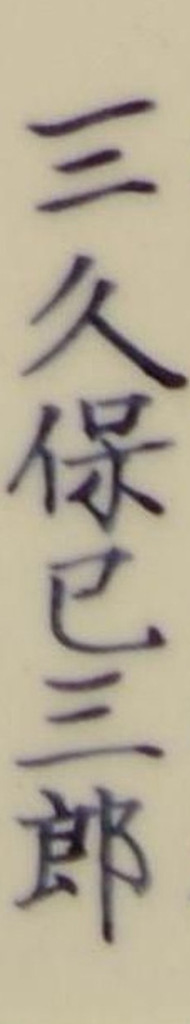三久保巴三郎
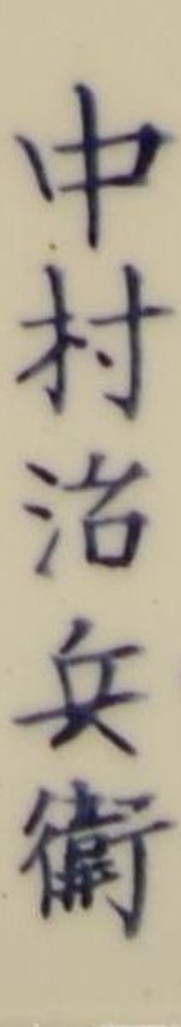中村治兵衛
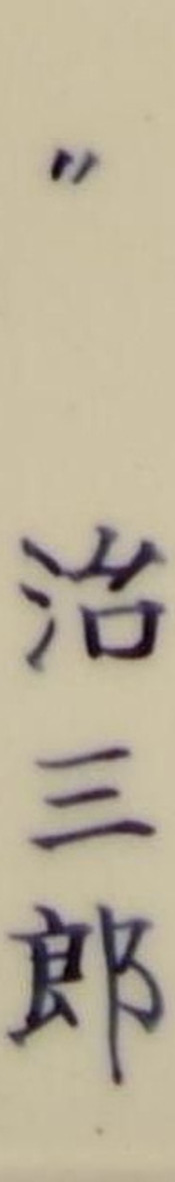治三郎
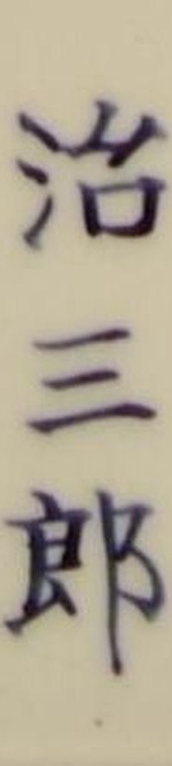治三郎
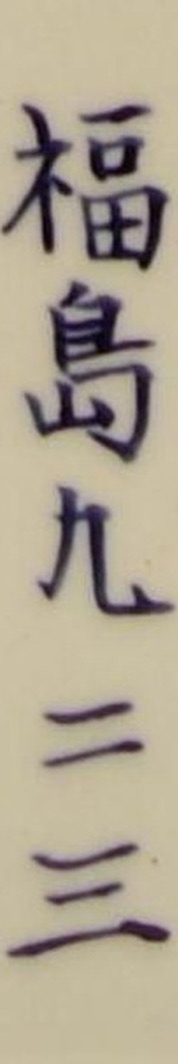福島九二三
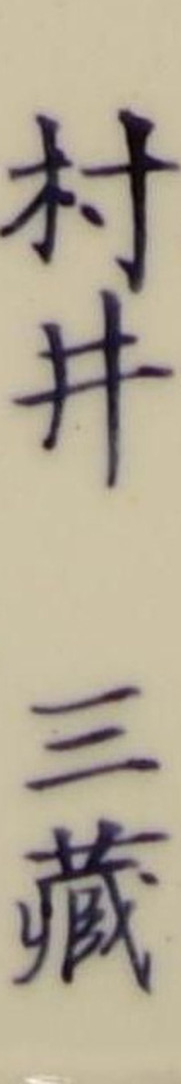村井三蔵
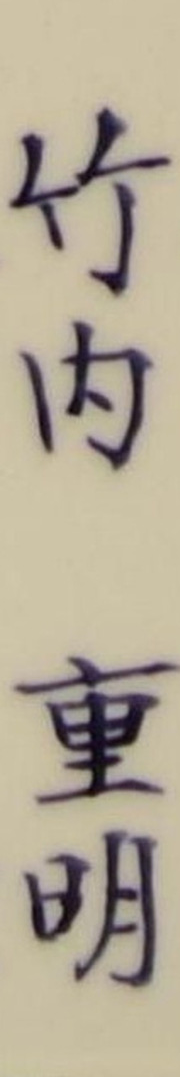竹内重明
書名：A~D
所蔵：koyasan kongobuji
